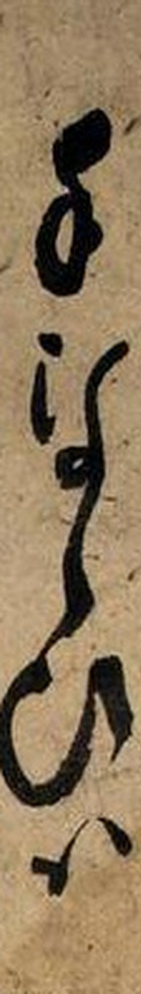手ならひは
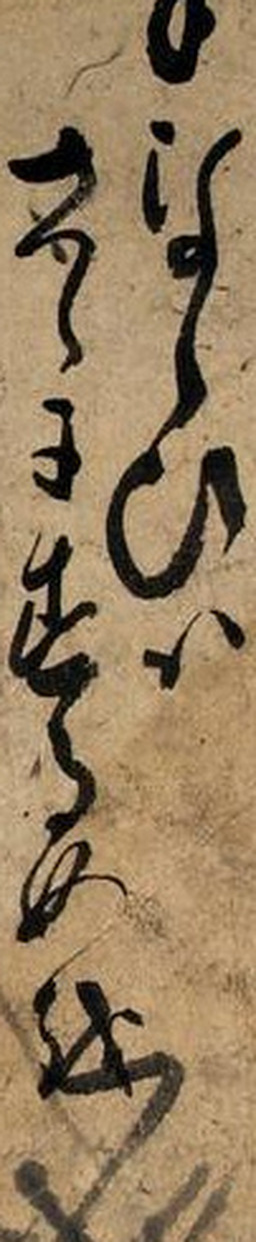さかにするめを
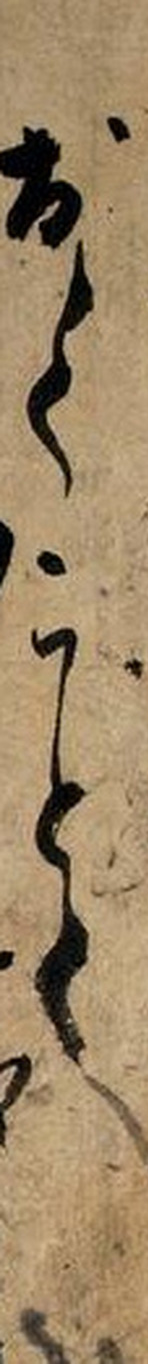おくことし
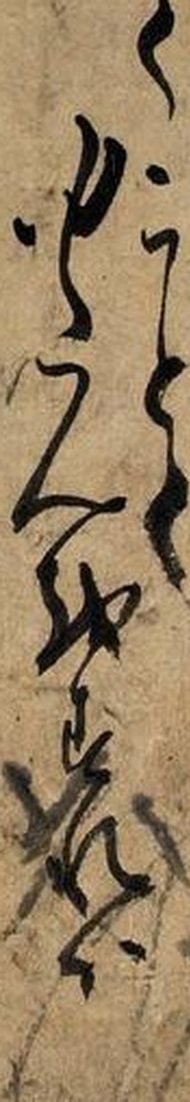ゆたんをすれは
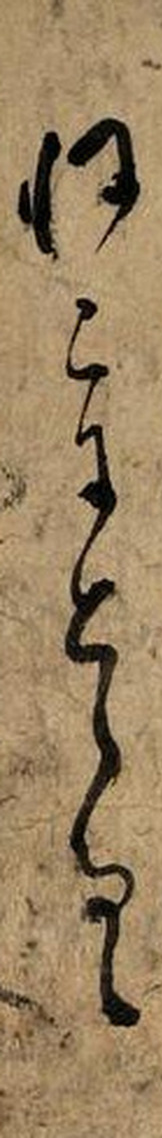ねこにとらるゝ
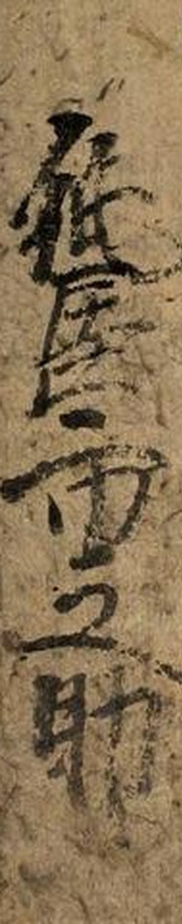紙屋市之助

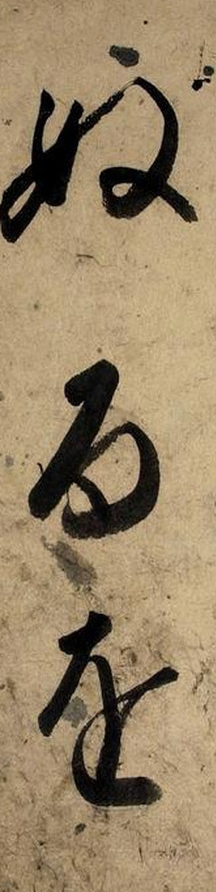ぬるを
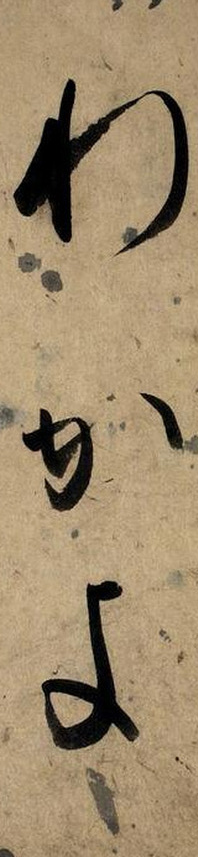わかよ

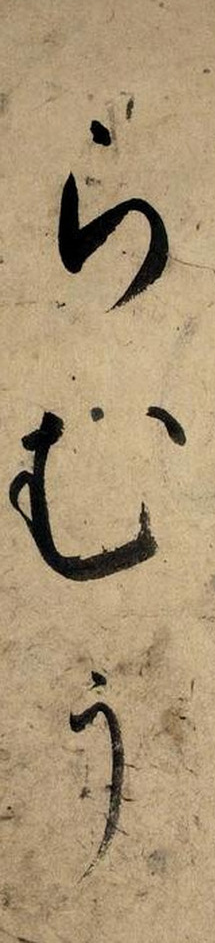らむう
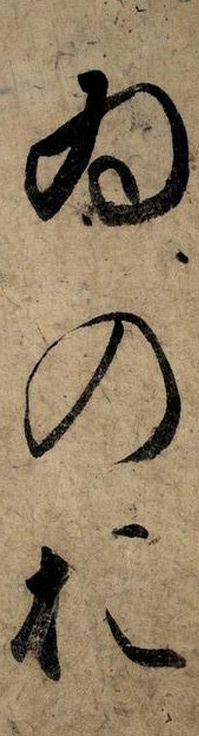ゐのお

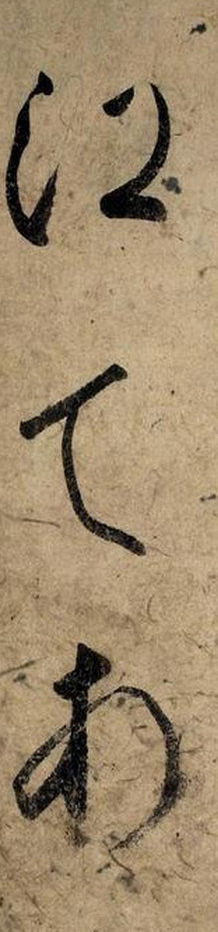えてあ
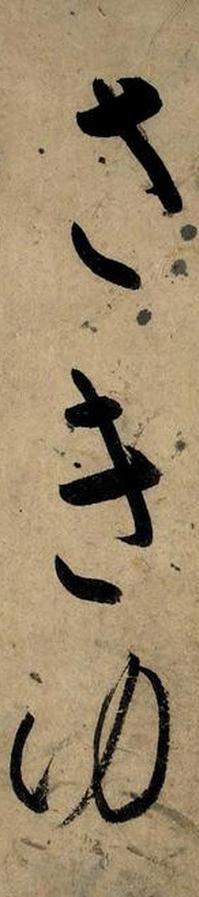さきゆ

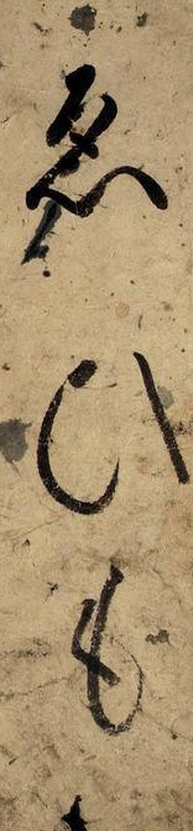ゑひも
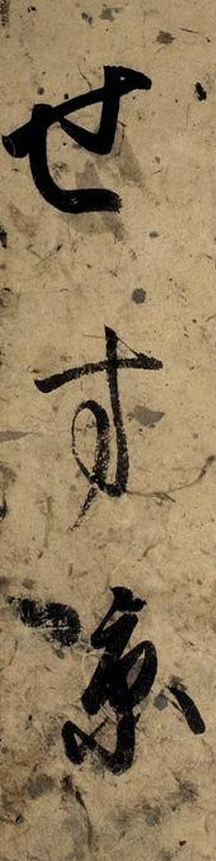せす京
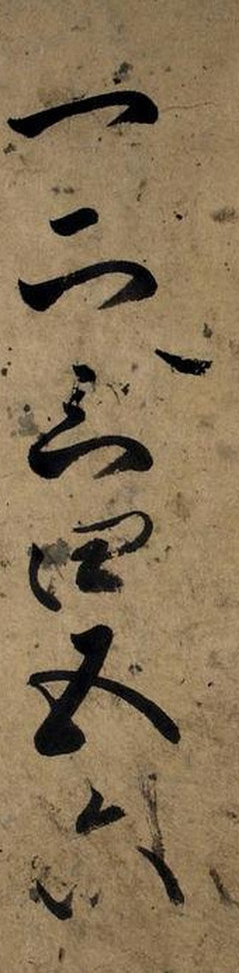一二三四五六
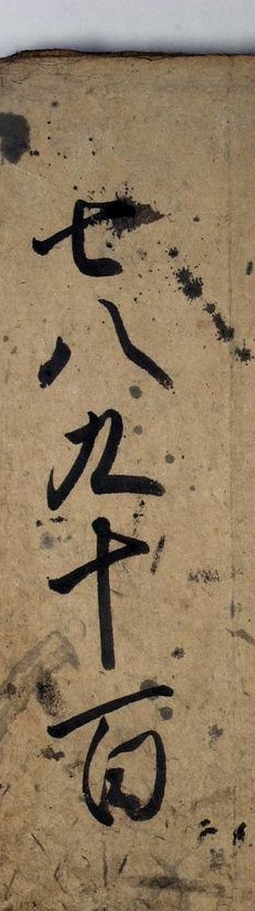七八九十百
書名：御手本（手習、いろは・数字、「名頭之事」「親戚字尽」「相庭之…
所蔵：福井県文書館 Fukui Prefectural Archives
